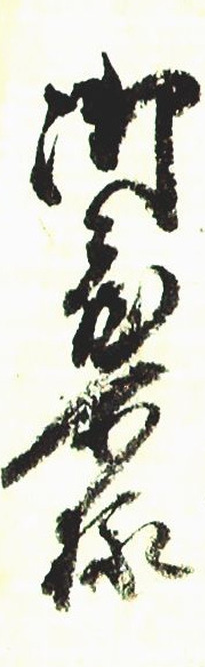御蔵所様
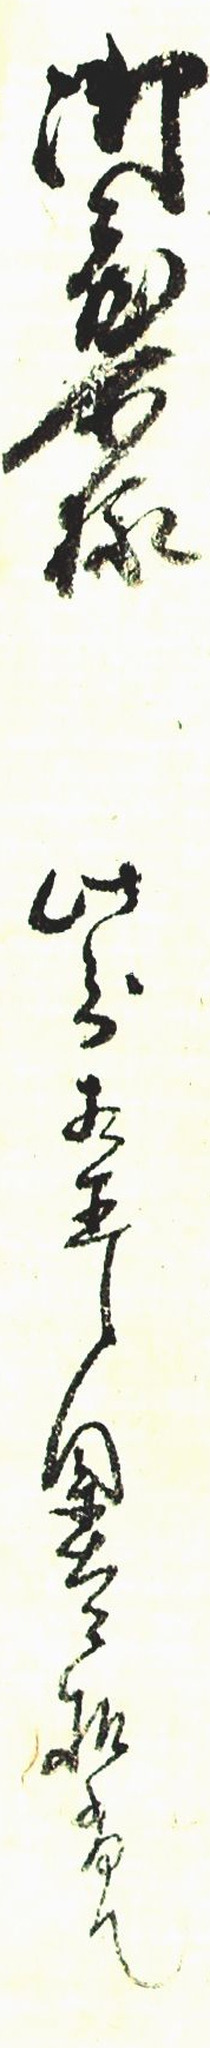御蔵所様此分相直し奥候扣覚

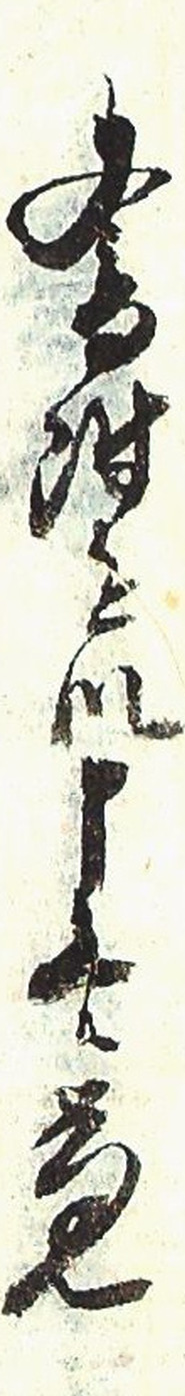書附を以申上る覚
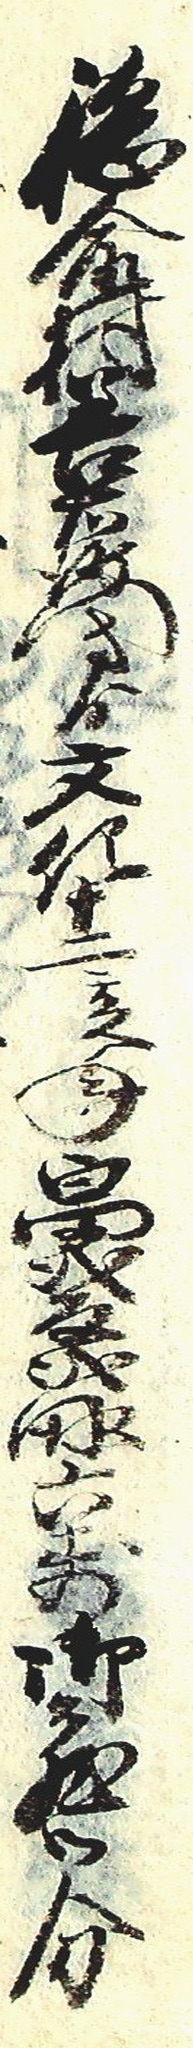徳命村善右衛門方ゟ文化十二亥年畠弐反弐畝六歩御蔵御分
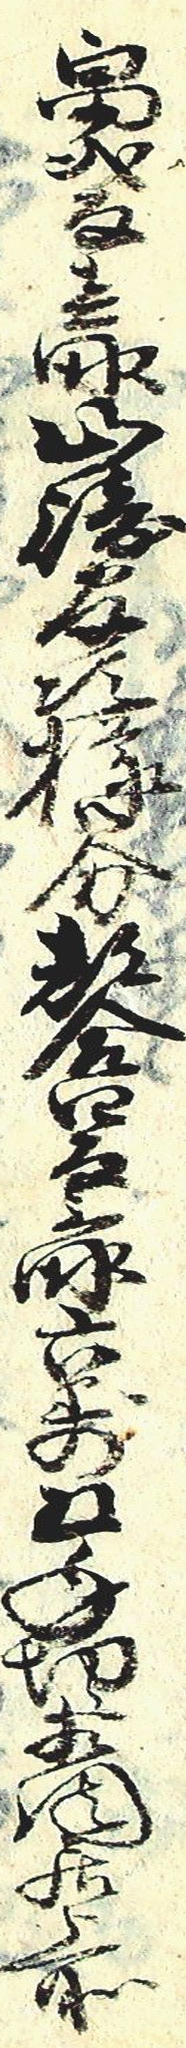畠弐反壱畝山崎官次様御分都合四反三畝六歩五年切に相調居申所
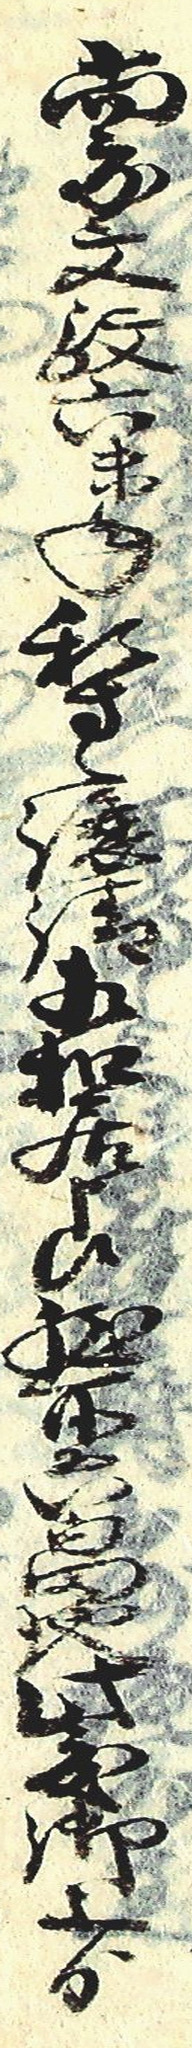尚亦文政六未年私方へ譲請相扣居申候然所右畠地此度御上ゟ
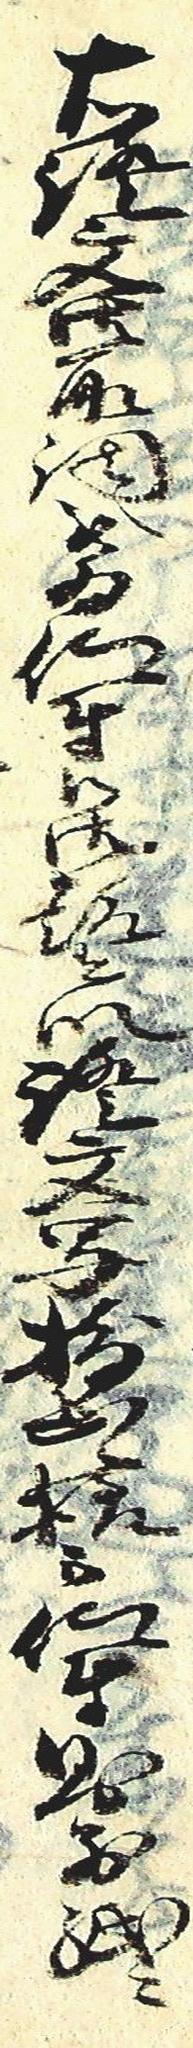右証文御取調へ被為仰付候御趣を以証文写指出候様被仰付則別紙に
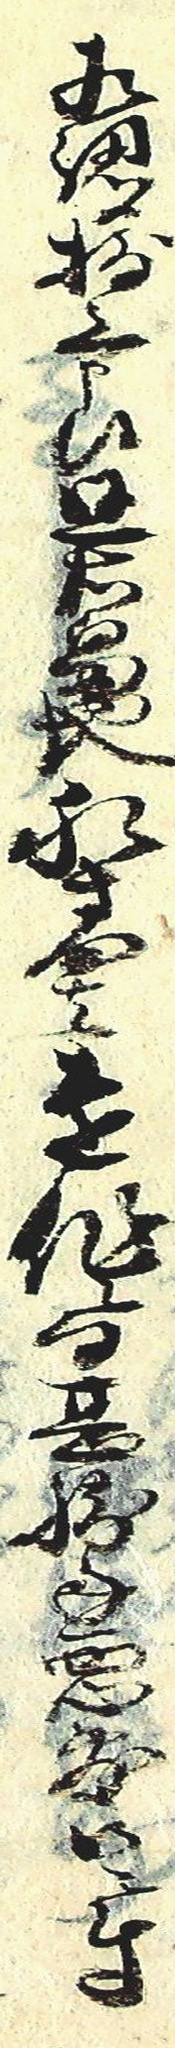相認め指上申候且右畠地私方ゟは遠作にて甚勝手悪敷候に付
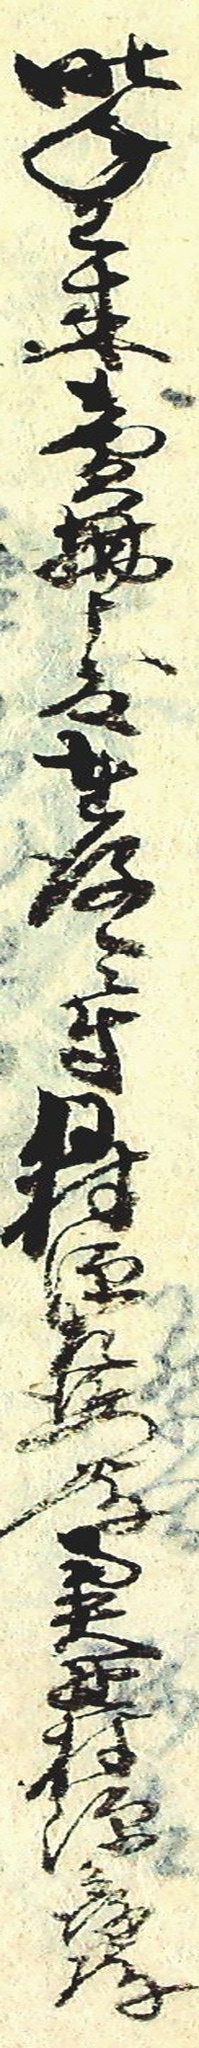昨年已来売払申度奉存候に付同村源左衛門殿奥野村源兵衛殿
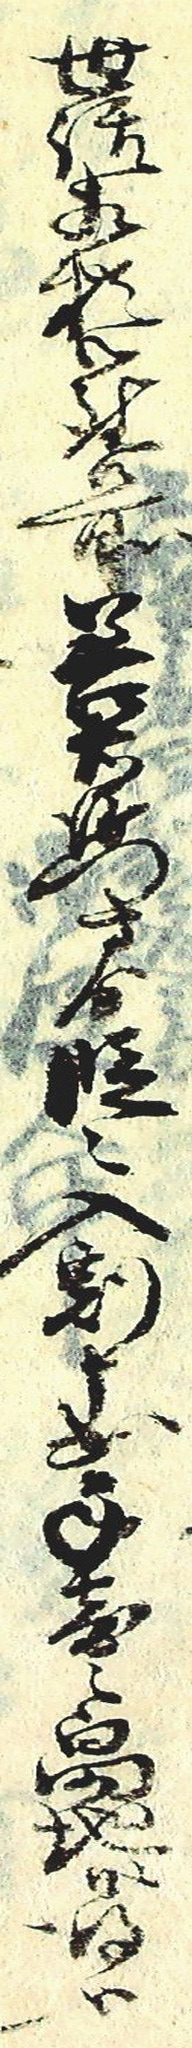世話相頼御座候所善右衛門方ゟ段々入割申出手寄之畠地に候得は
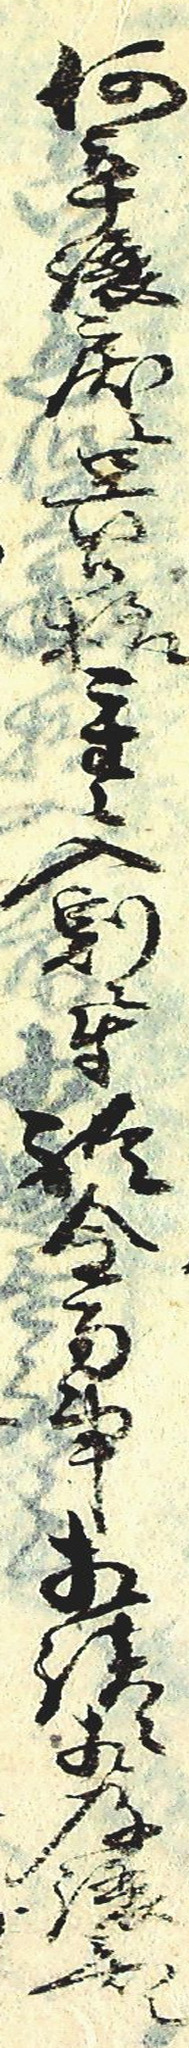何卒譲戻し呉候様重々入割に付礼金万事相談に相及譲戻し
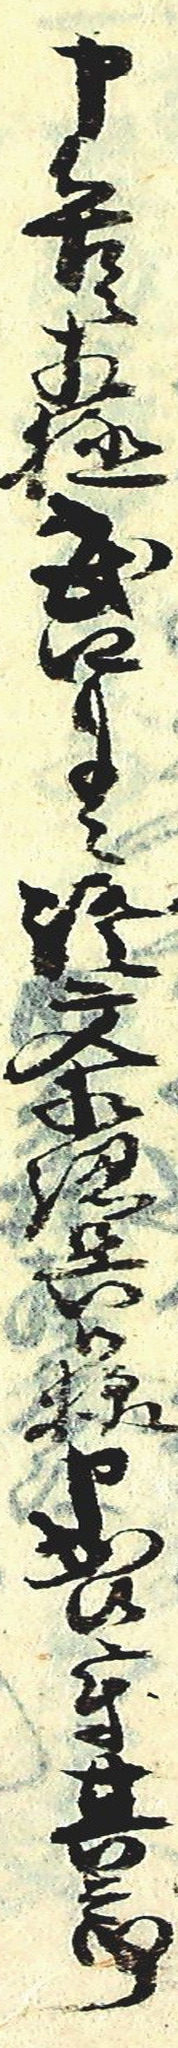申筈に相極当四月に証文相認呉候様申出候に付其節
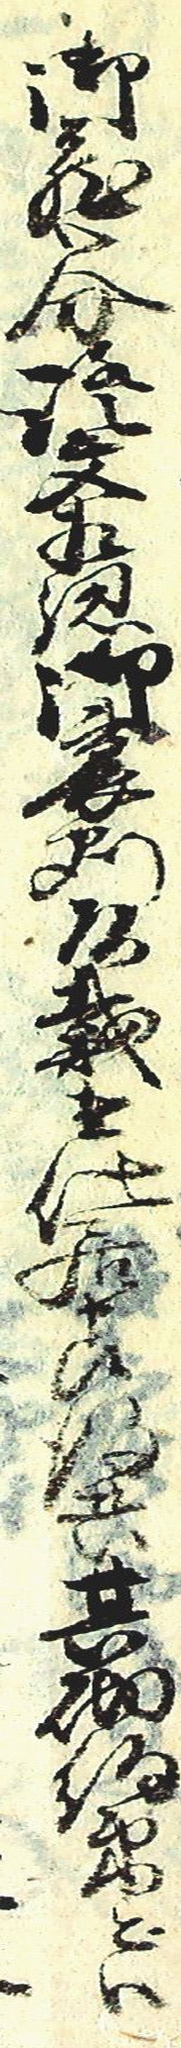御蔵御分証文相認御裏判頂戴奉仕居申候得共其砌約束とは
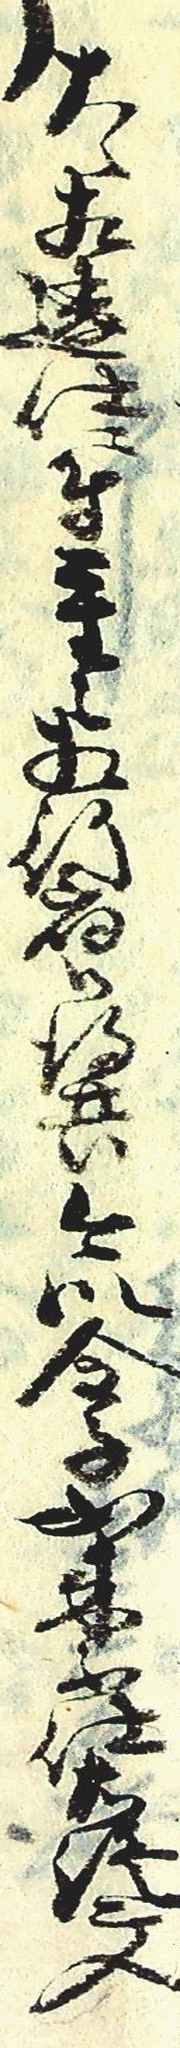大に相違仕に付重々相行着候得共今以金子出来不仕右証文
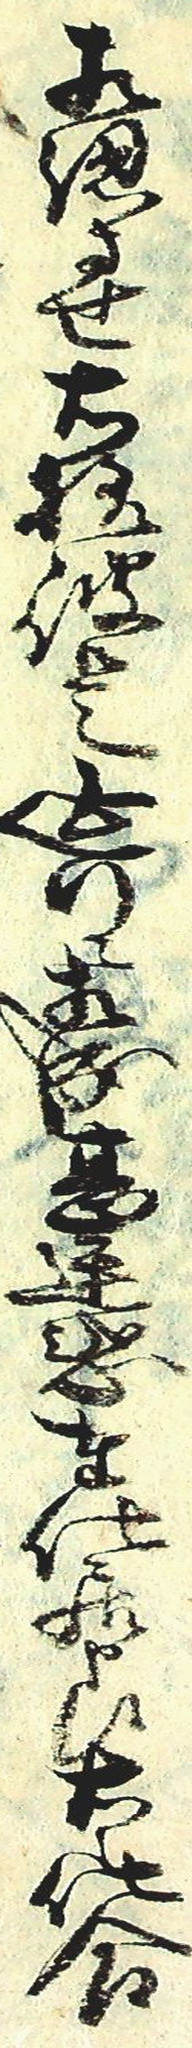相認させ右様彼是延引に相成甚迷惑奉仕居申候右仕合
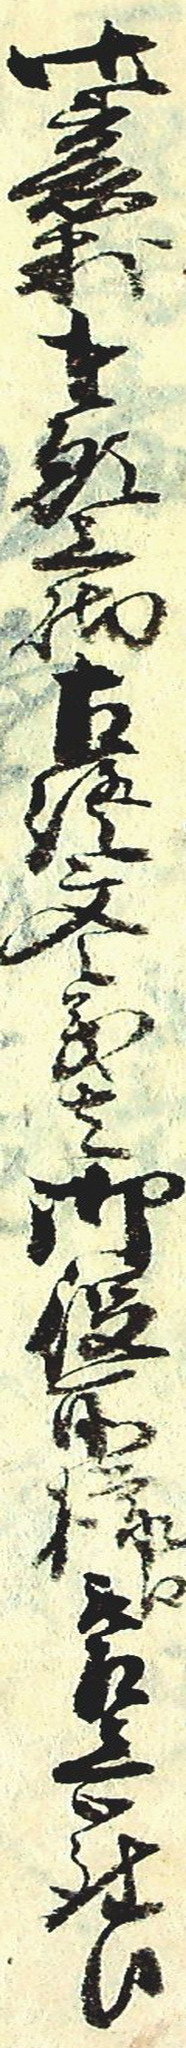御裏判奉願上砌古証文之義は御役所様え被召上御座候
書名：諸御願書控(弐番）
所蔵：鳴門教育大学 Naruto University of Education
